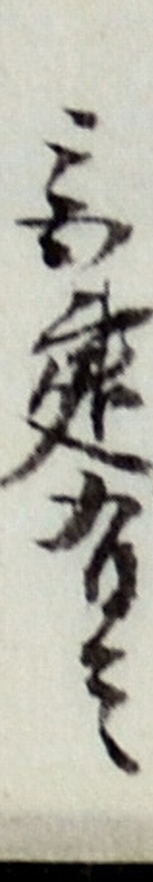宮建有之
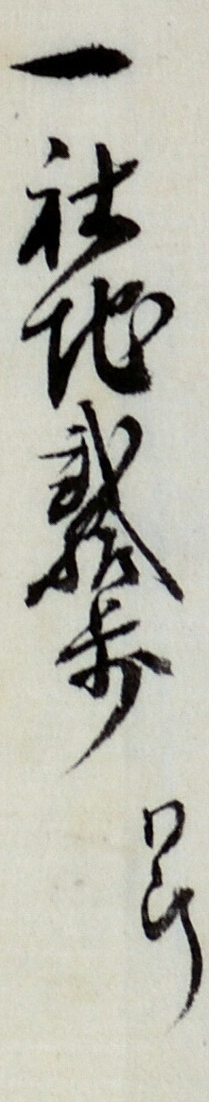一社地弐拾八歩氏神
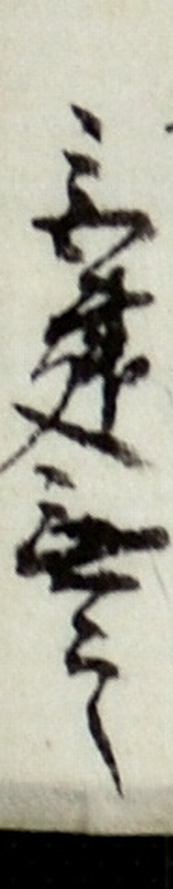宮建無之
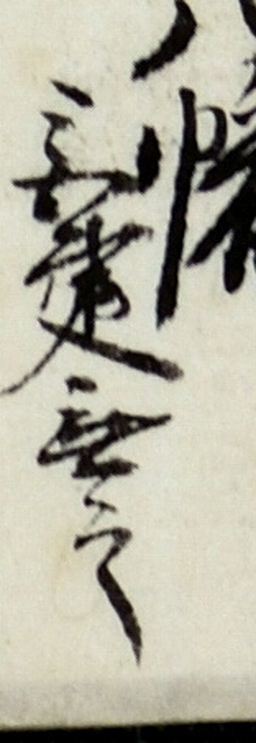宮建無之
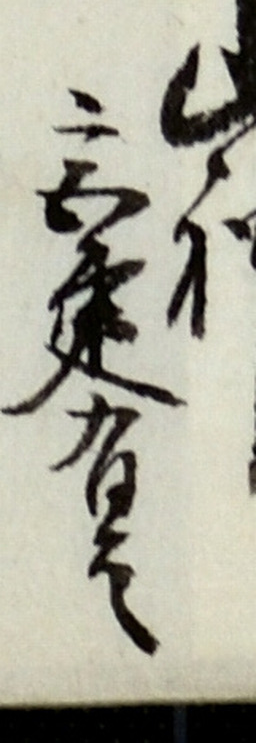宮建有之
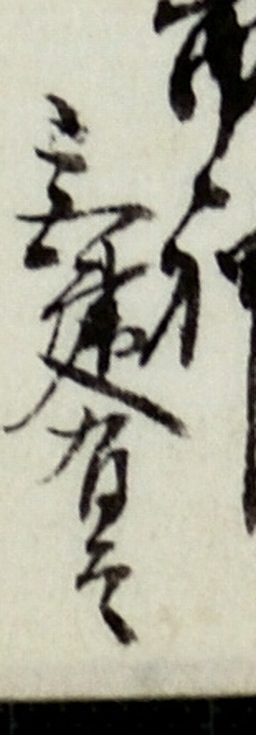宮建有之
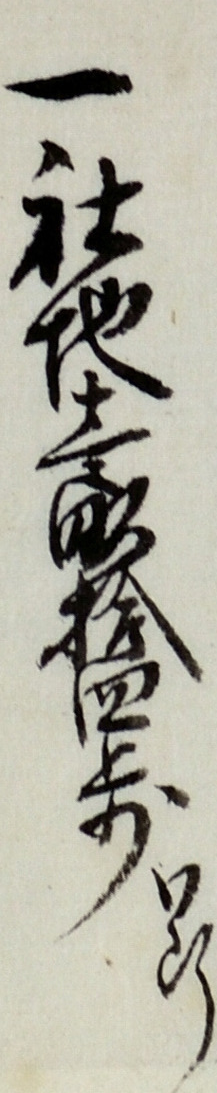一社地壱畝拾四歩若宮
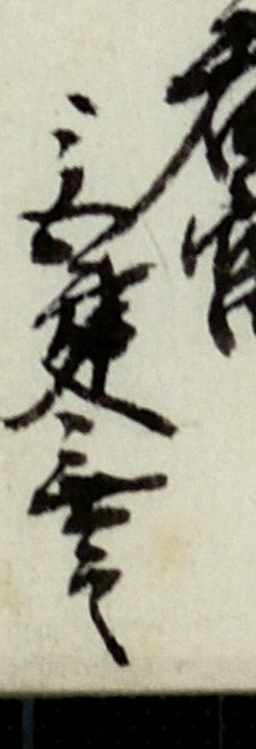宮建無之
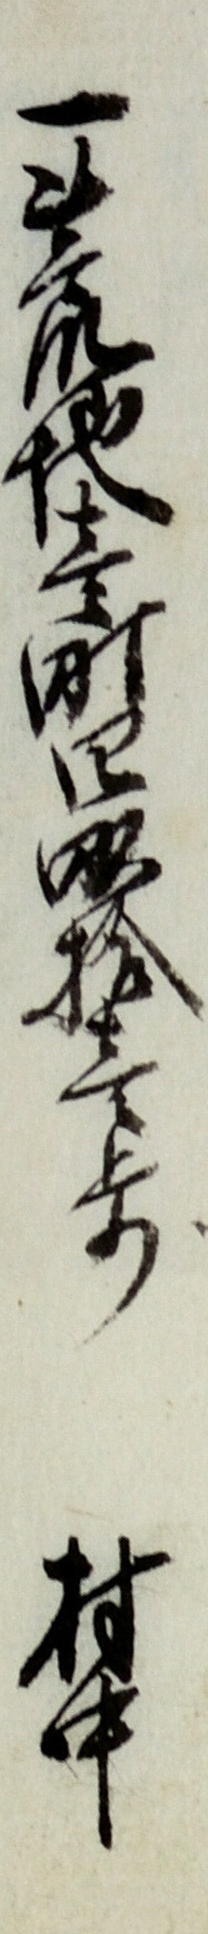一荒地壱町四畝拾壱歩村中

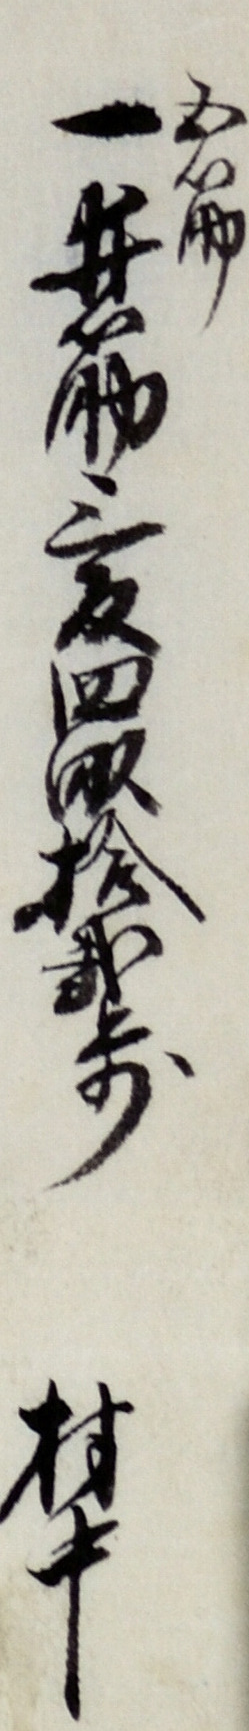一井筋三反四畝拾弐歩村中
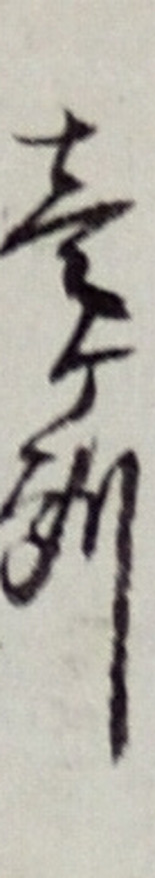壱ヶ所
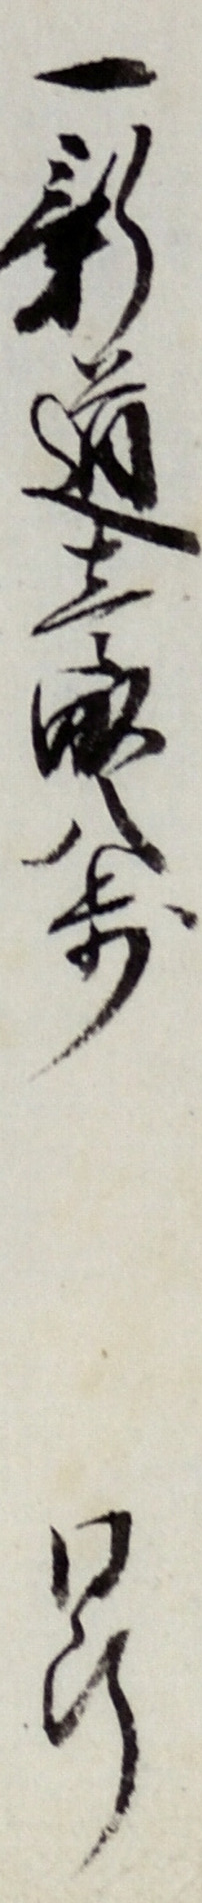一影道壱畝八歩同断
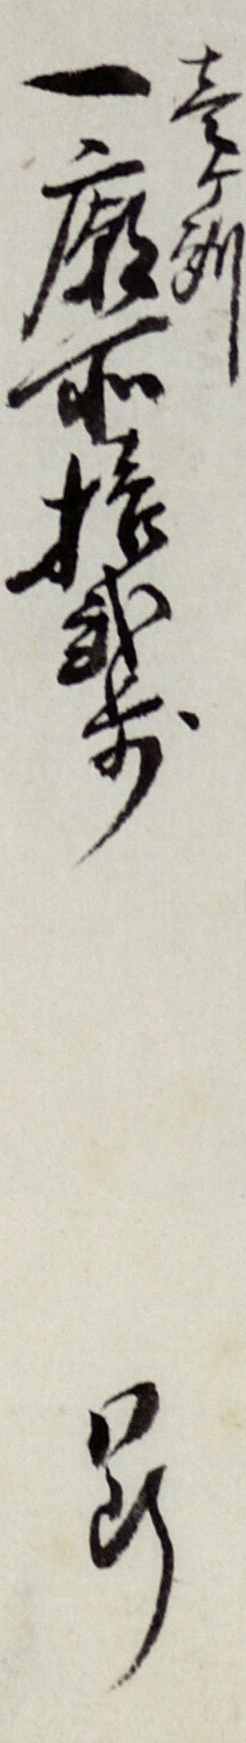一廟所拾弐歩同断
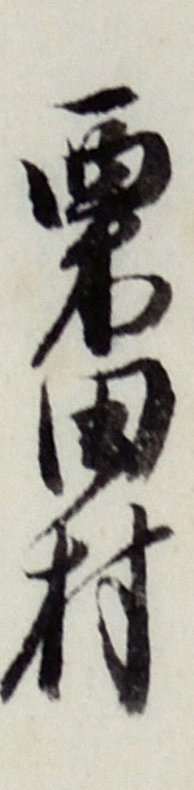栗田村
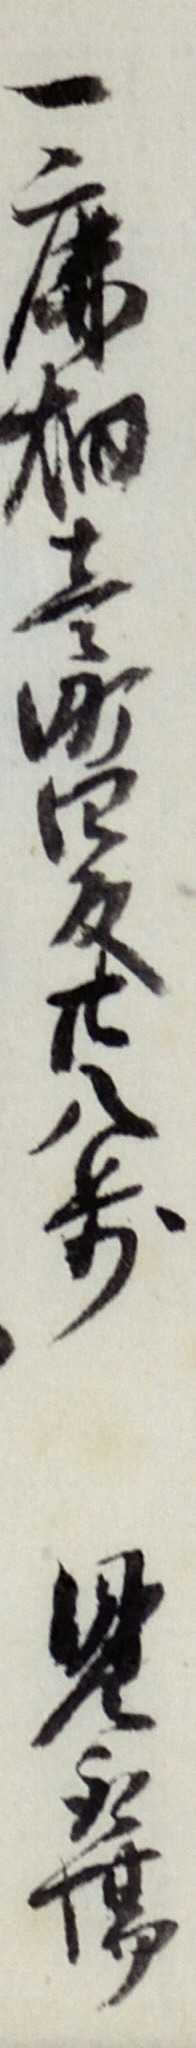一麻畑壱町四反廿八歩見取場
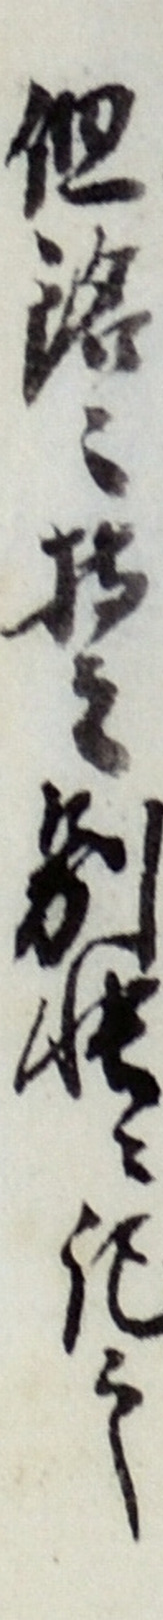但銘々持主別帳ニ記之
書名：御領分中山林社地手控
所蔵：伊那市立高遠町図書館・合同会社AMANE
